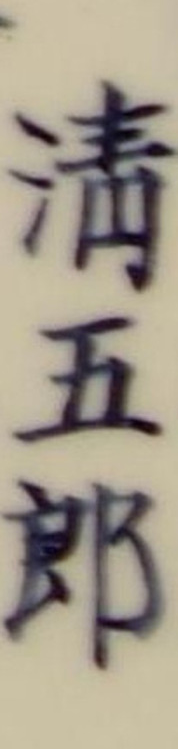清五郎
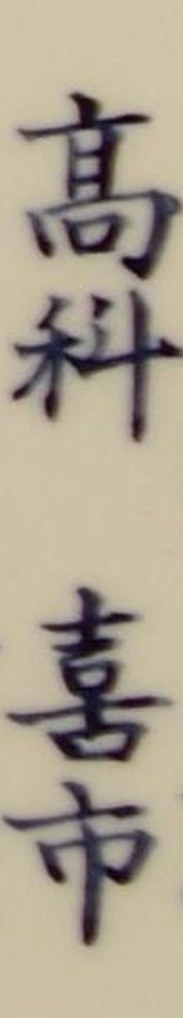高科喜市
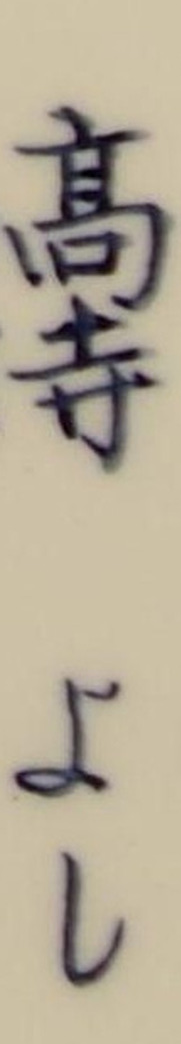高寺よし
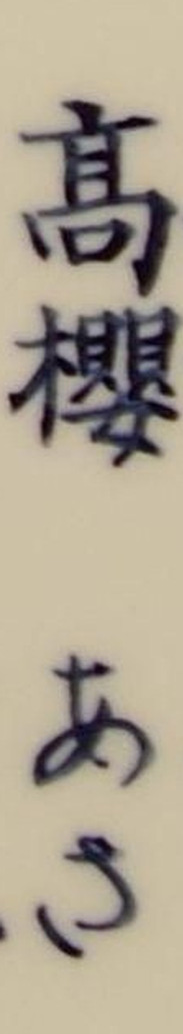高桜あさ
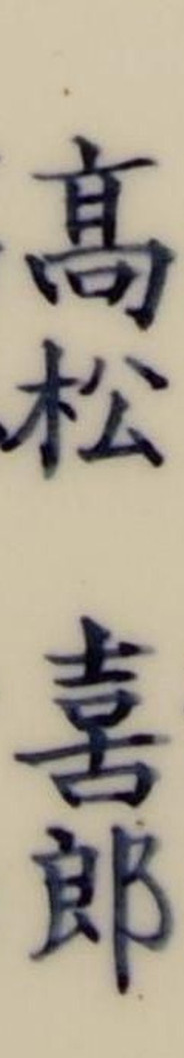高松喜郎
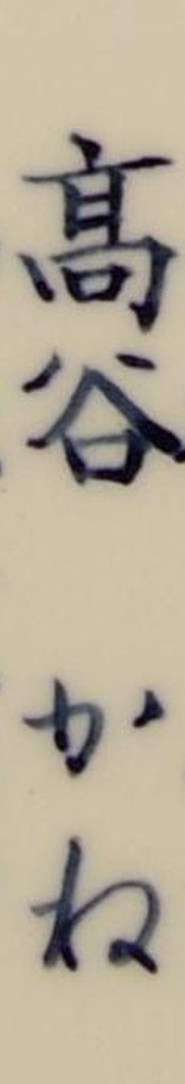高谷かね
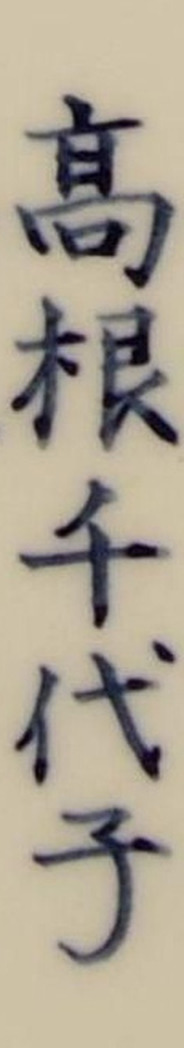高根千代子
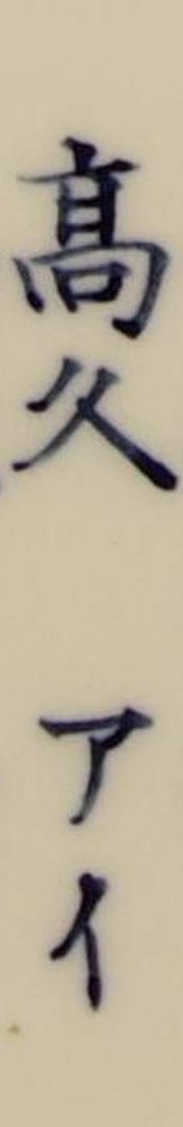高久アイ
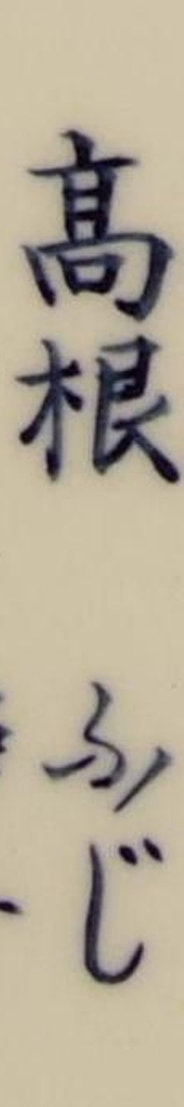高根ふじ
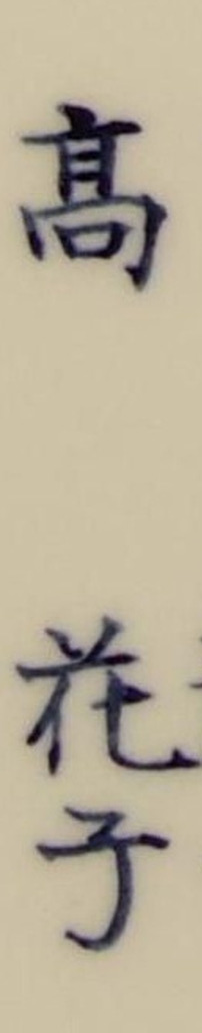高花子
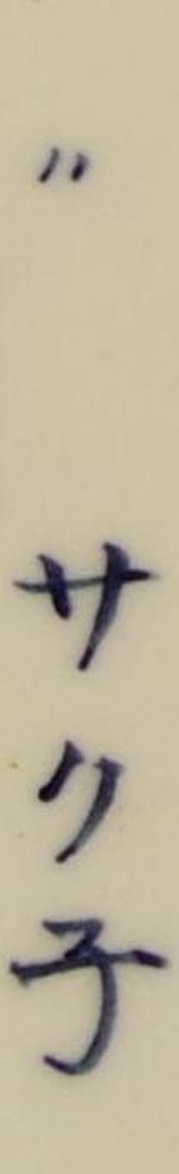サク子
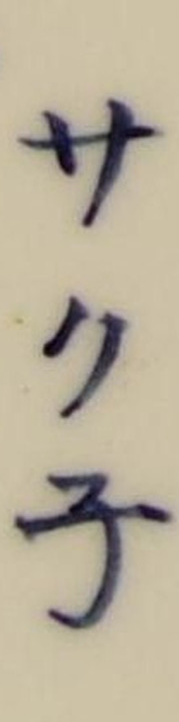サク子
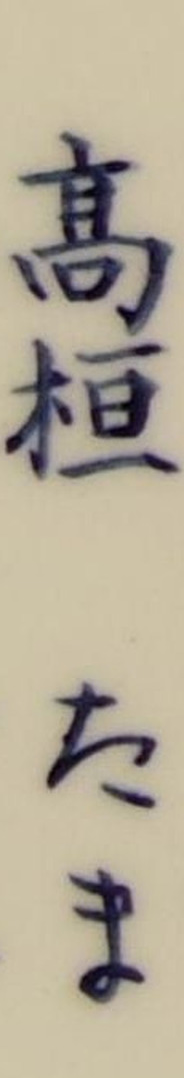高桓たま
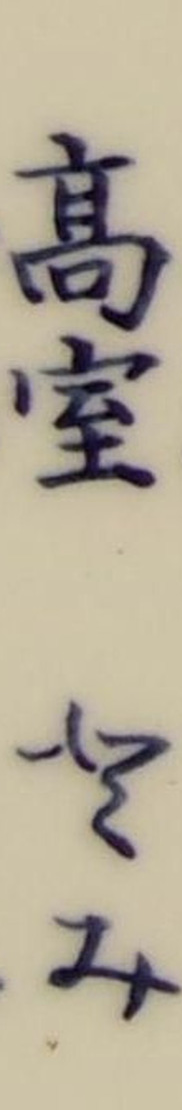高室とみ
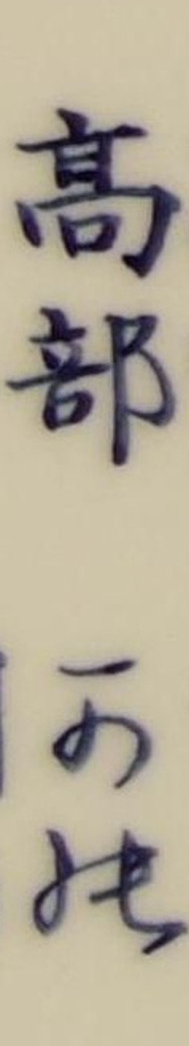高部かの
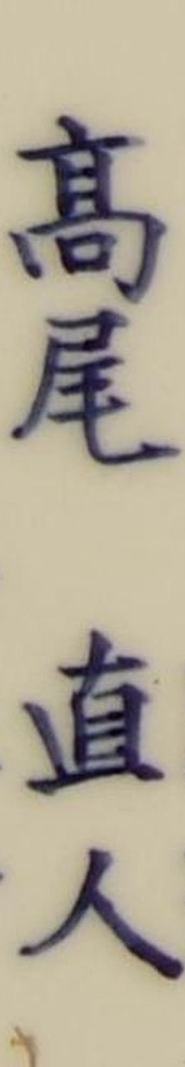高尾直人
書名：E~L
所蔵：高野山金剛峯寺
